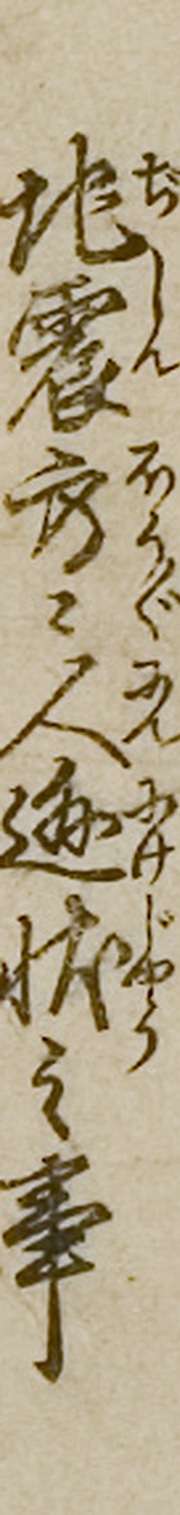地震方々人逃状之事
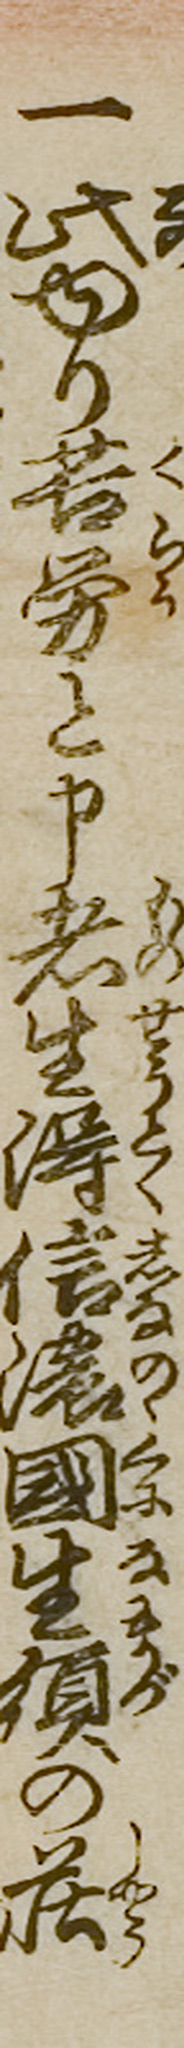一此ゆり苦労と申者生得信濃国生須の荘
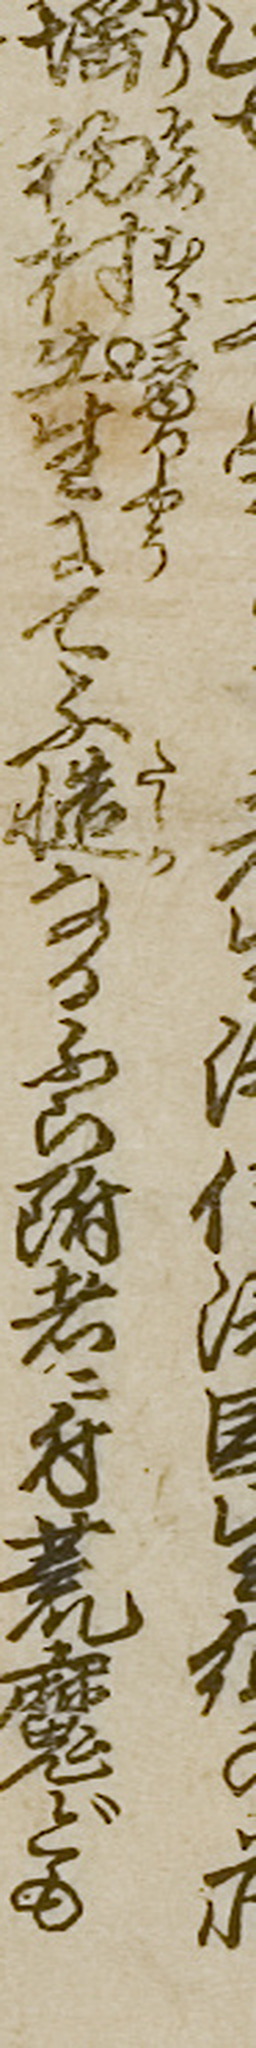揺初村出生にて不慥なるふら附者に付荒魔ども
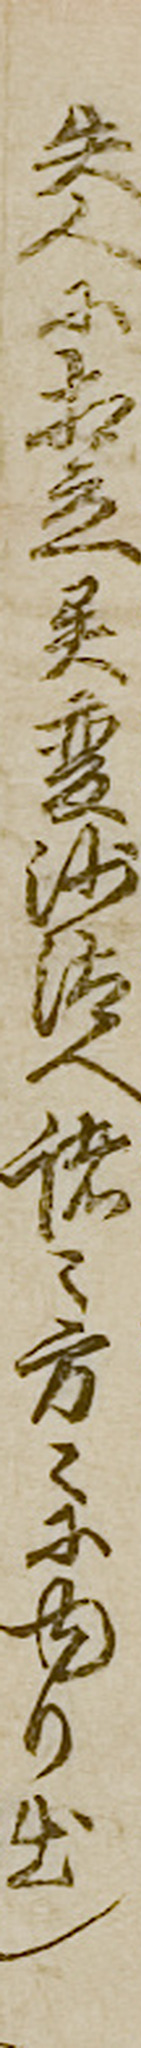失人に相立異変沙汰人諸々方々にゆり出し
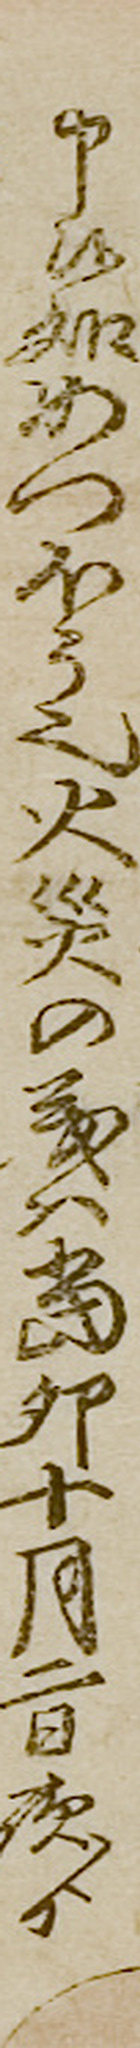申候処めつほう也火災の義は当卯十月二日夜より
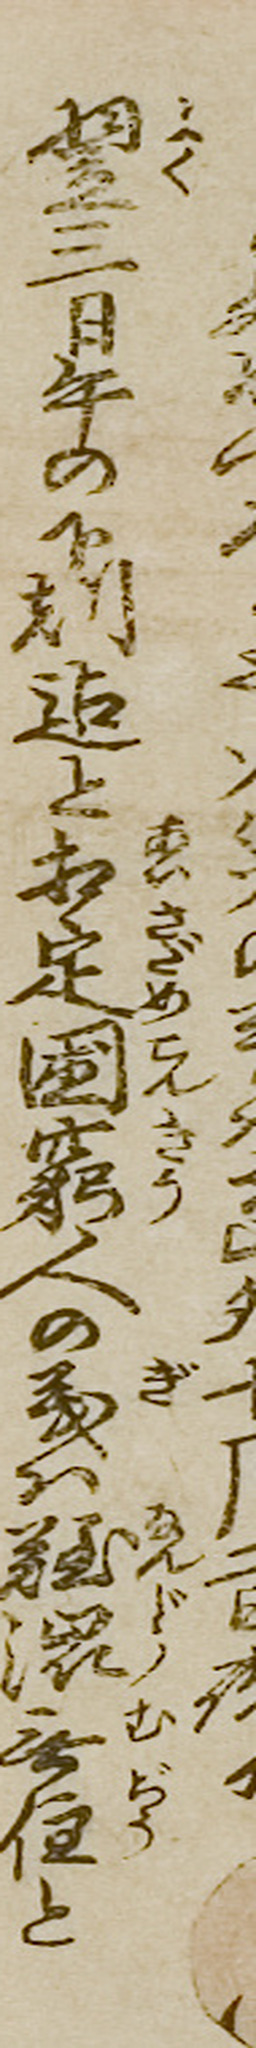翌三日午の下刻迄と相定困窮人の義は難渋無住と
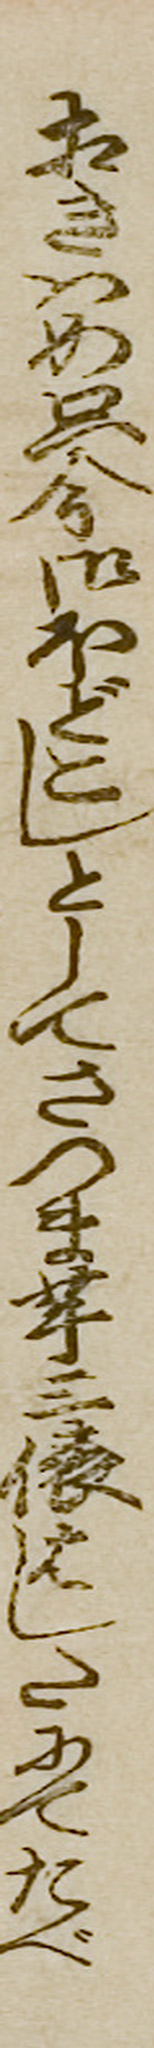相きはめ只今御ほどこしとしてさつま芋三俵はしたにてたべ
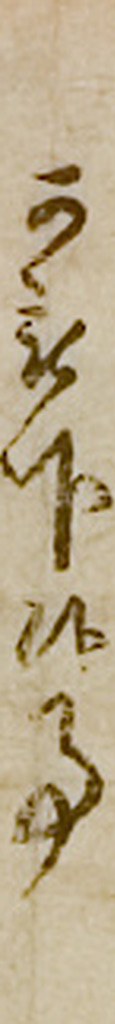可被下候事
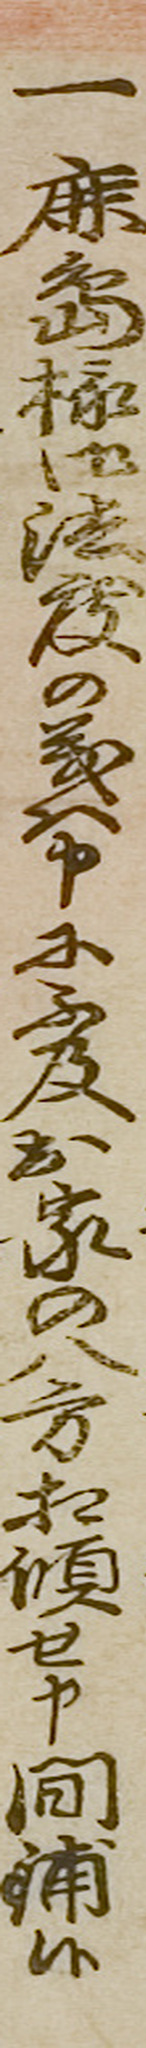一鹿島様御法度の義は申に不及お家の八方相傾せ申間鋪候
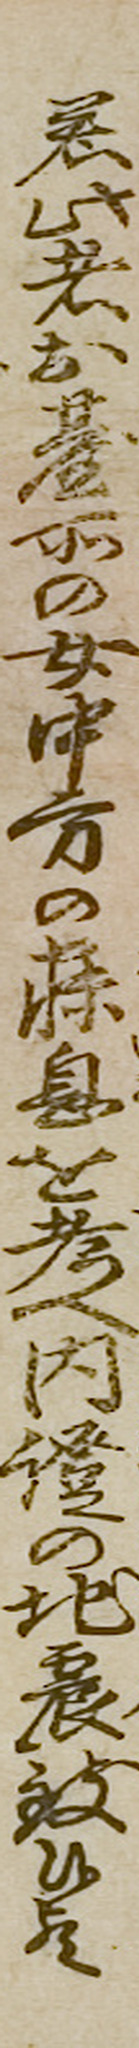若此者お台所の女中方の寝息を考へ内証の地震致候欤
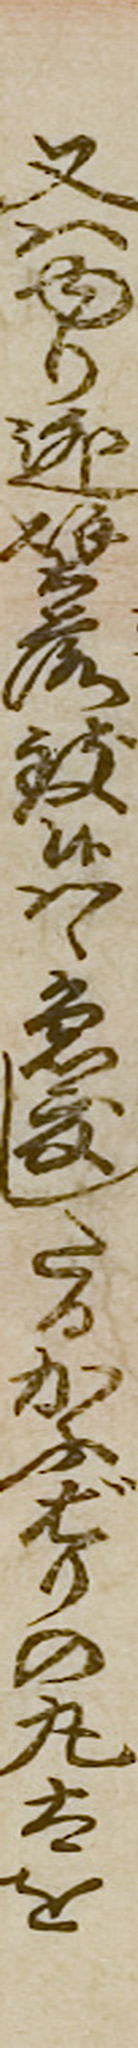又はゆり逃壁落致候はゝ急度したるかふばりの丸太を
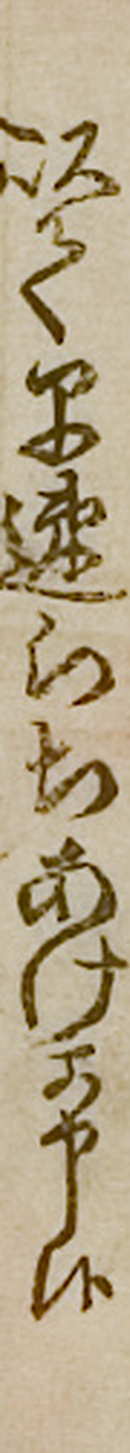以て早速らちあけ可申候
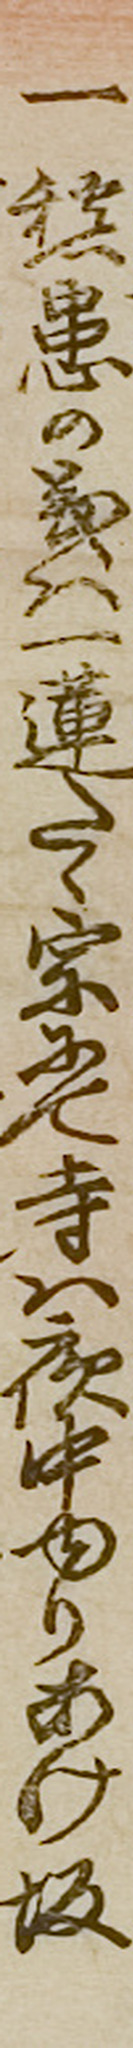一愁患の義は一蓮たく宗にて寺は夜中ゆりあけ坂
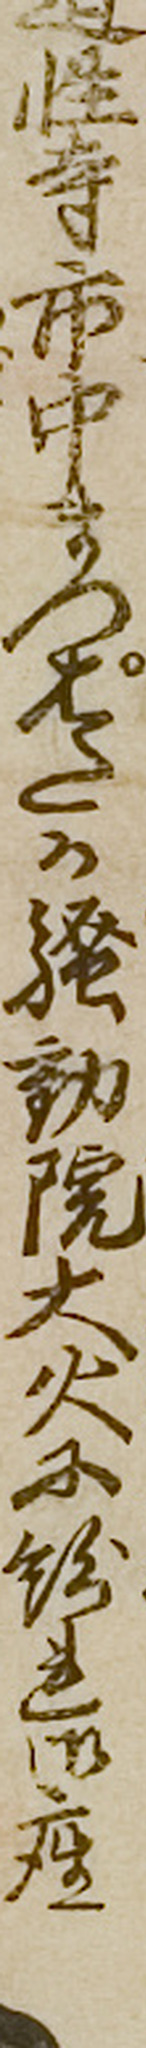道性寺市中まつぱたか騒動院大火に紛れ御座
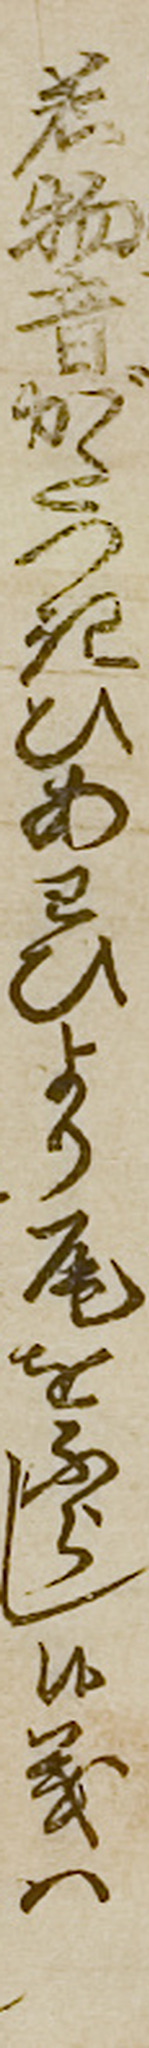若物音がたつきひめわひより瓦をふらし候義は
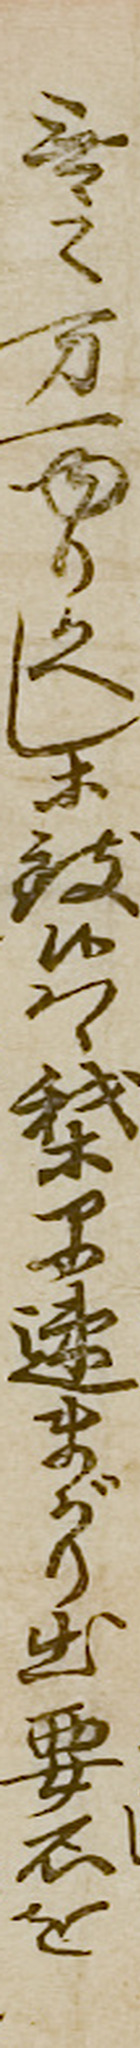無之万一ゆりかへし等致候はゝ我等早速まがり出要石を
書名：地震方々人逃状之事
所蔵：東京大学総合図書館 General Library in the University of Tokyo, JAPAN
